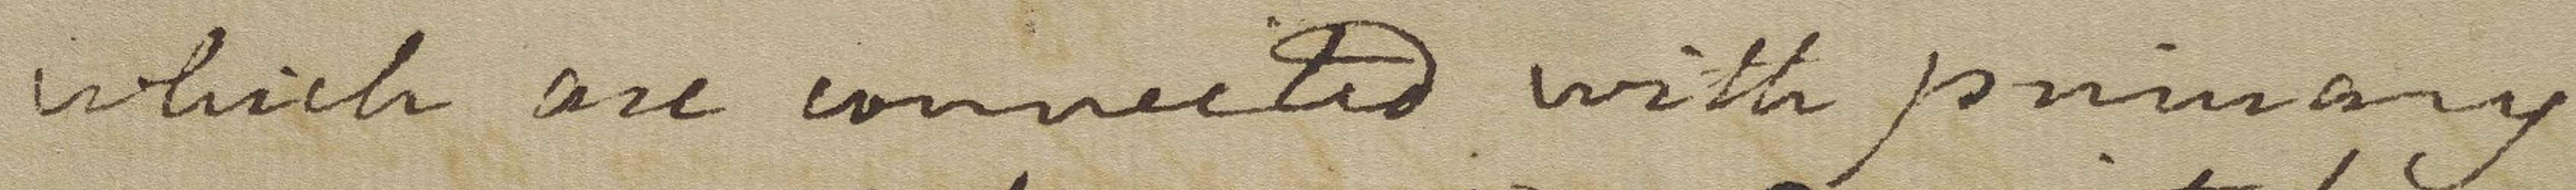which are connected with primary
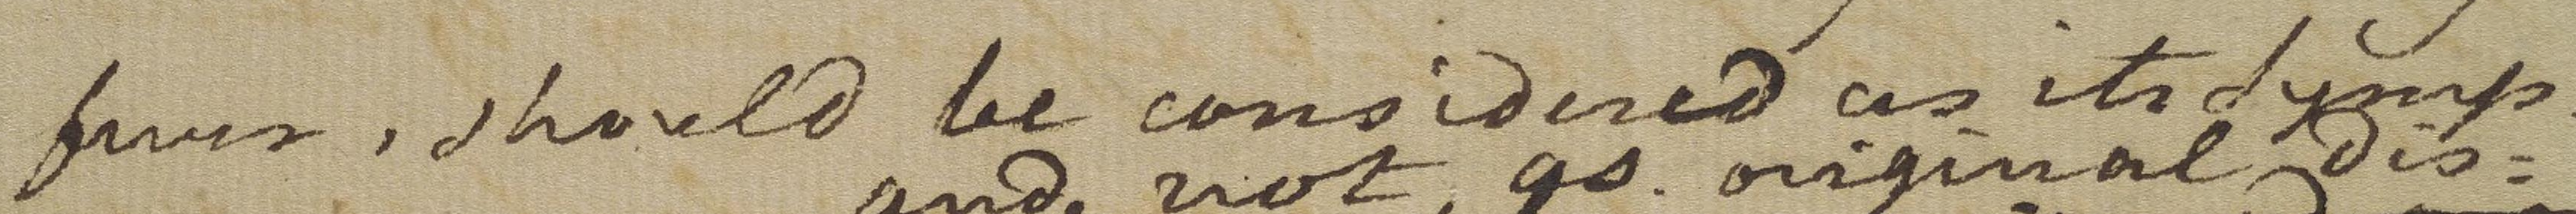fever, should be considered as its symp-
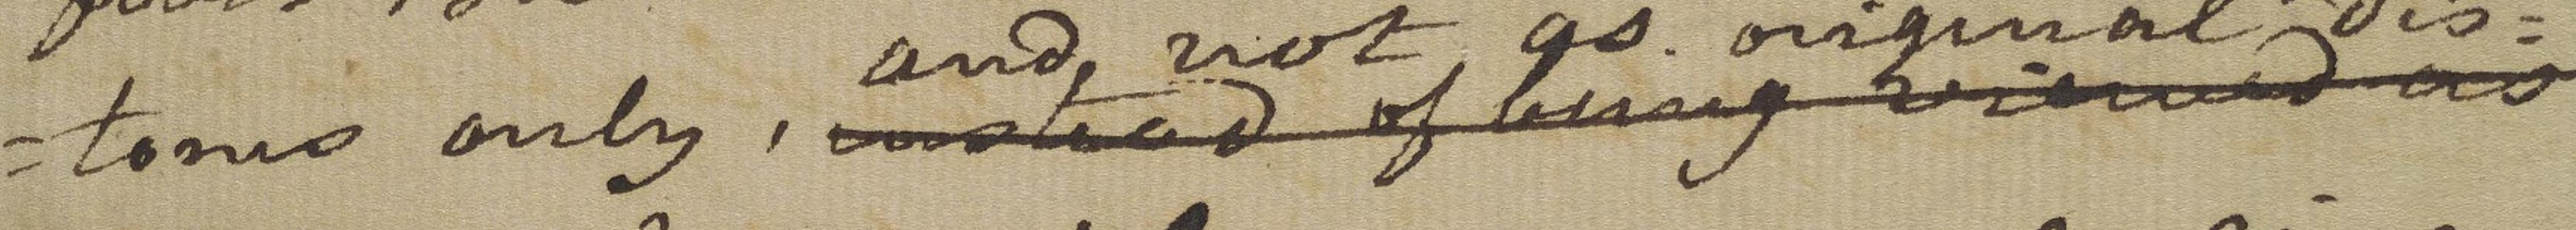-toms only, [instead of being viewed as]
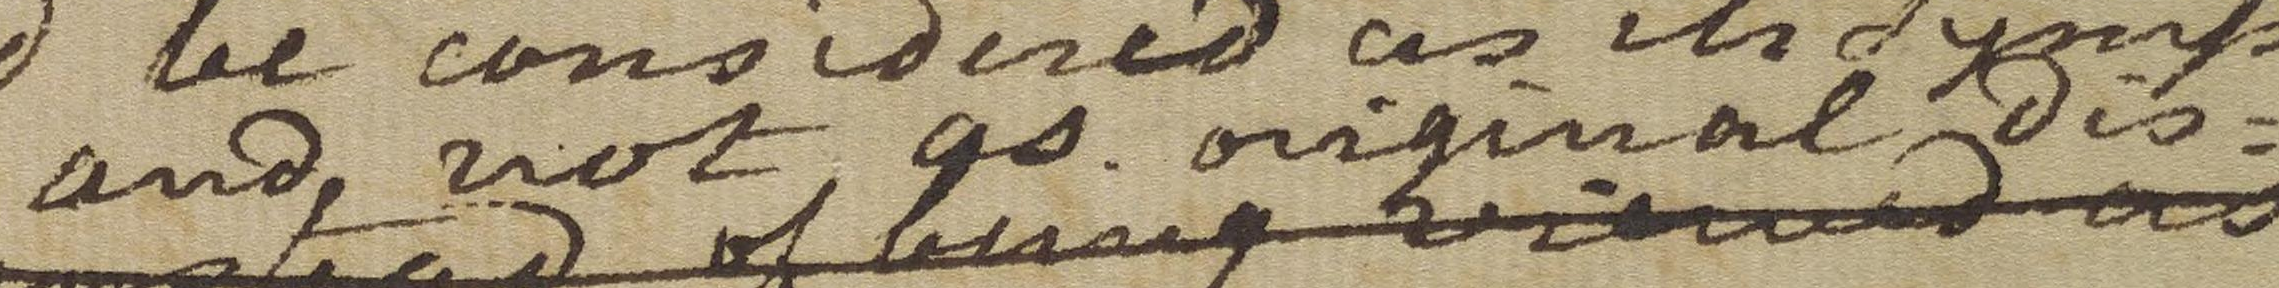and not as original dis-
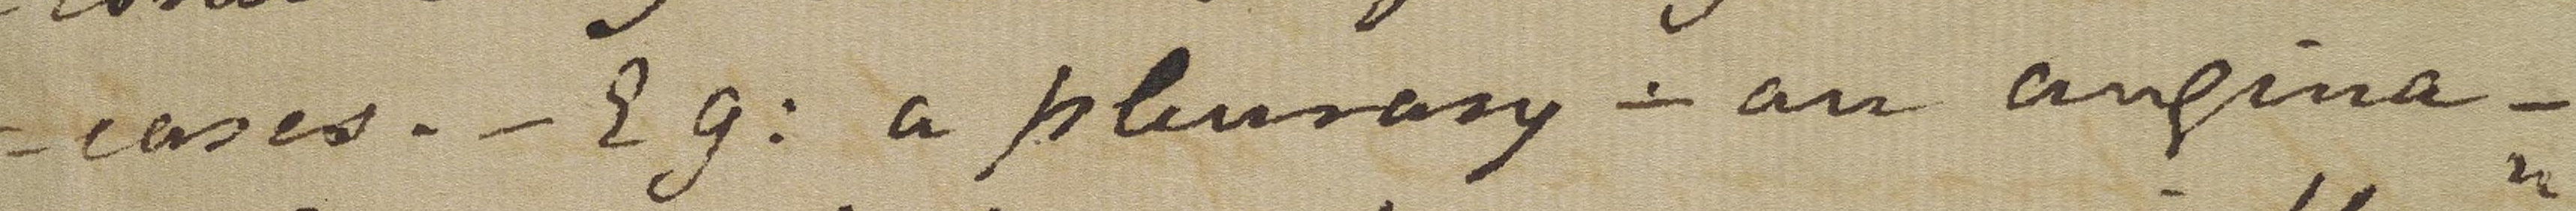-eases.- Eg: a pleurasy- an angina-
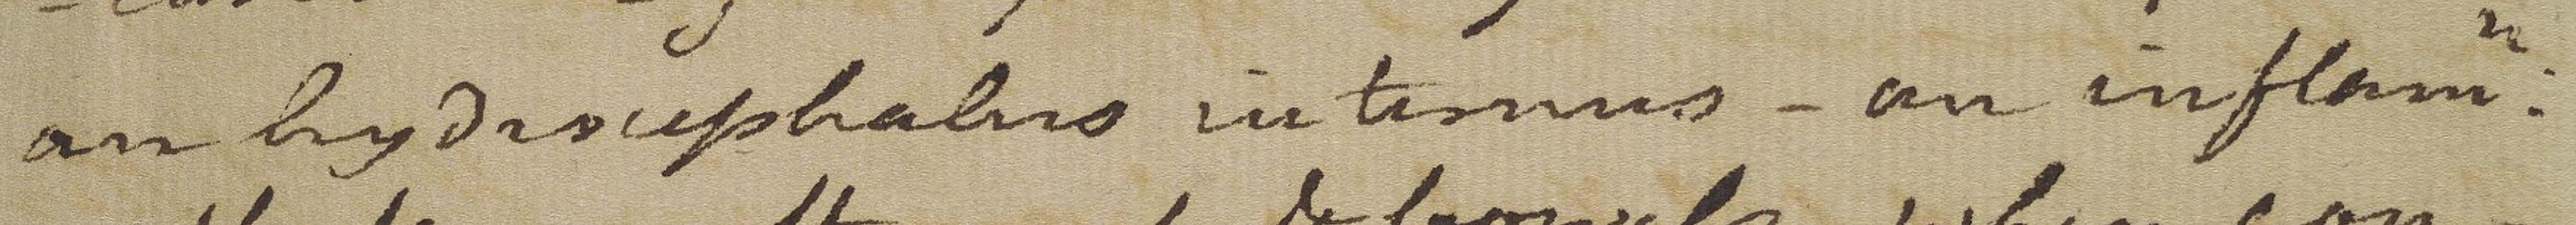an hydrocephalus intermes, an inflam^n
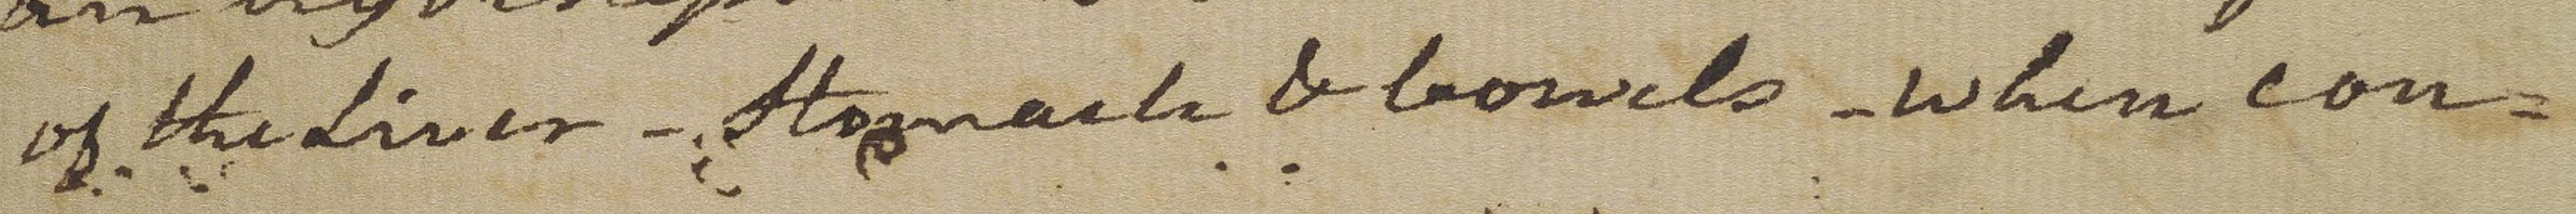of the liver, stomach & bowels, when con-
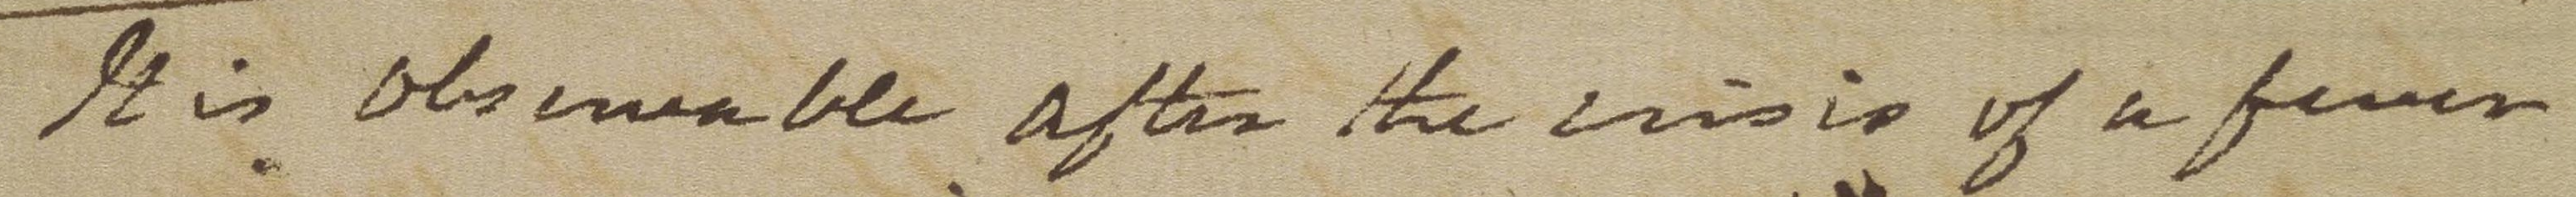It is observable after the risic of a fever
